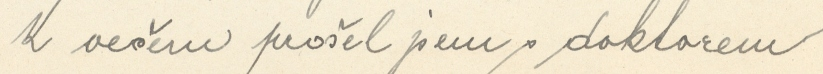K večeru prošel jsem s doktorem
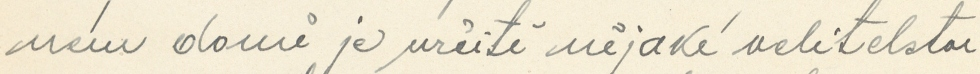ném domě je určitě nějaké velitelství
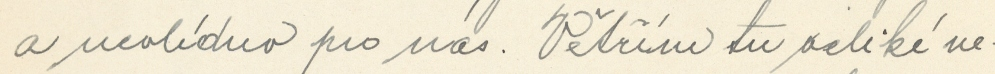a nevlídno pro nás. Větřím tu veliké ne-
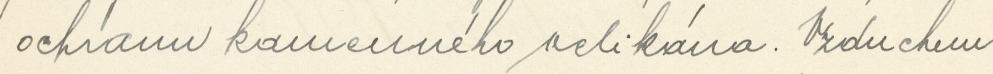ochranu kamenného velikána. Vzduchem
